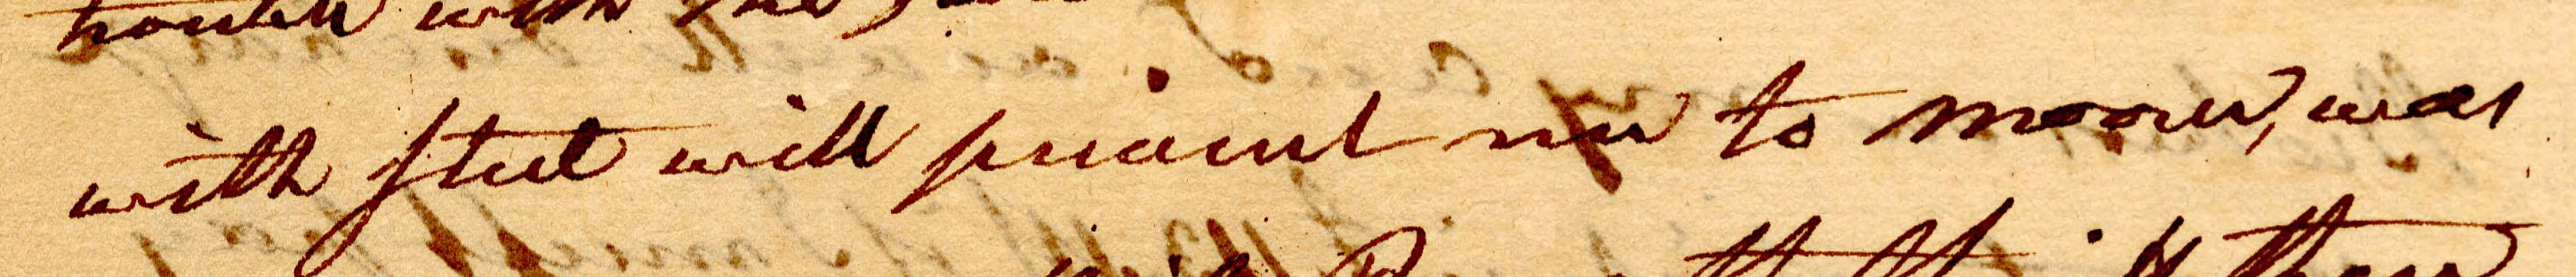with stul will present me to morrow, was
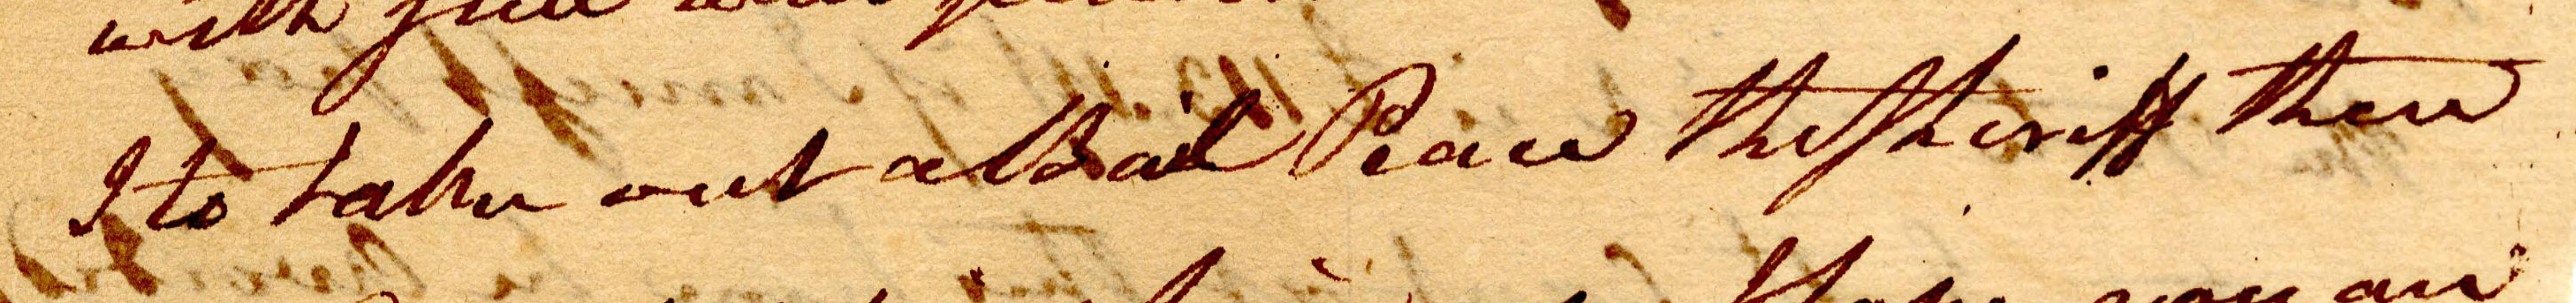& to take out a Bail Peace the sheriff there
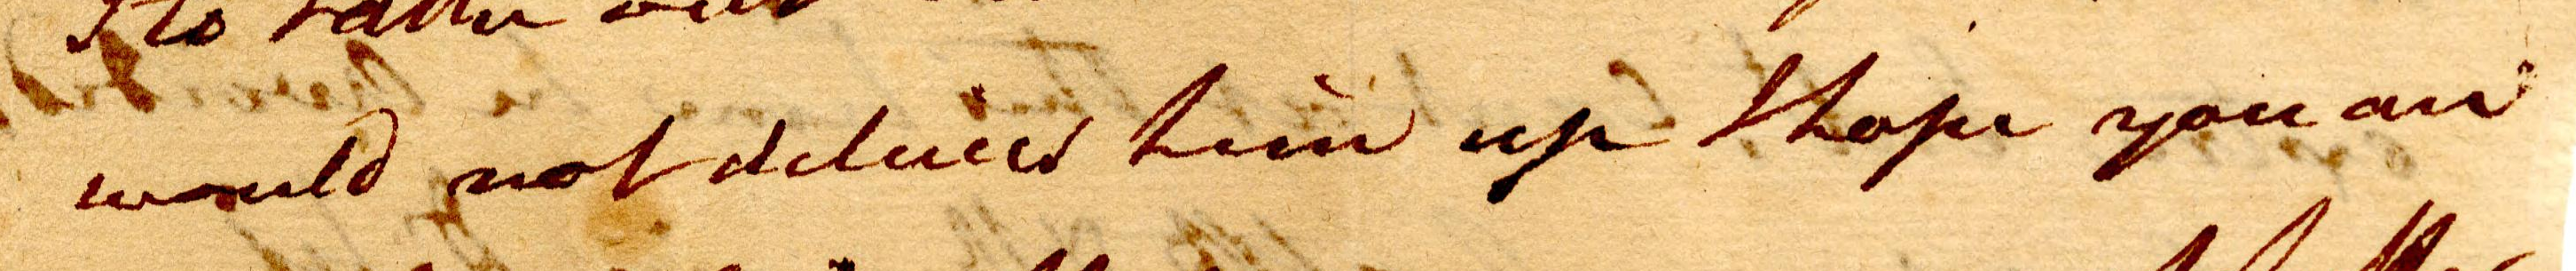would not deliverd him up I hope you are
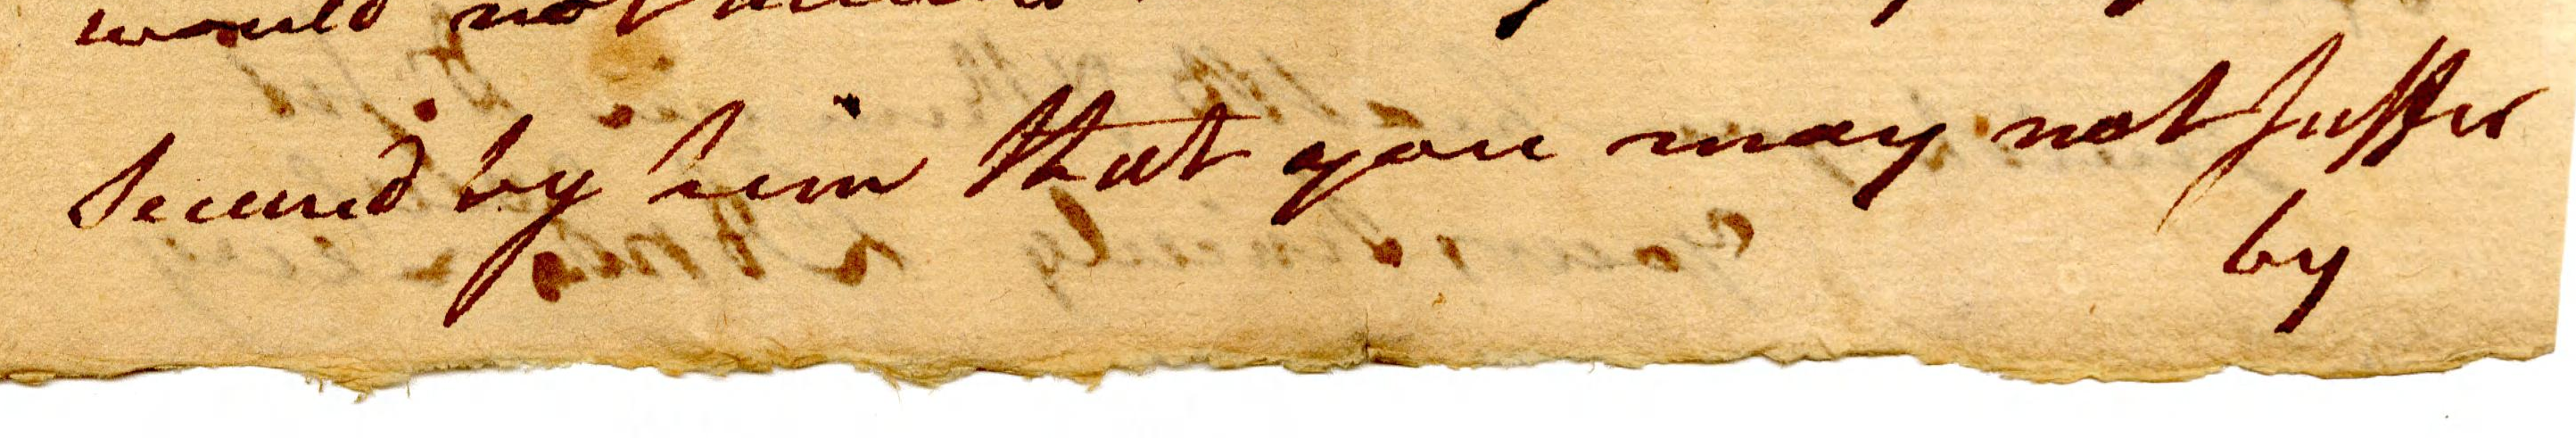secured by him that you may not suffer
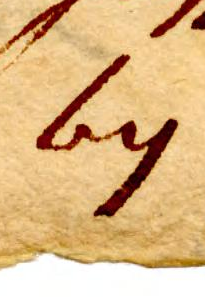by
